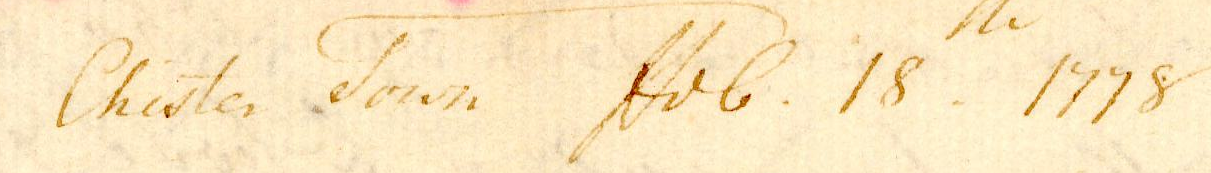Chester Town Feb. 18^th. 1778
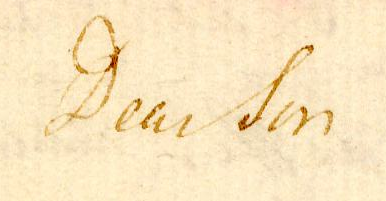Dear Sir
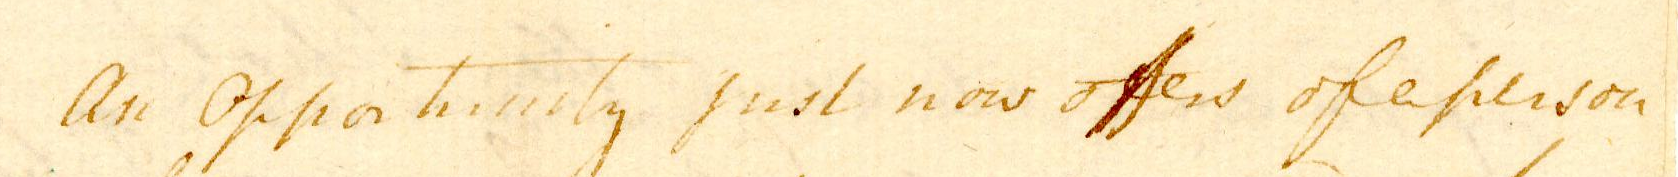An opportunity just now offers of a person
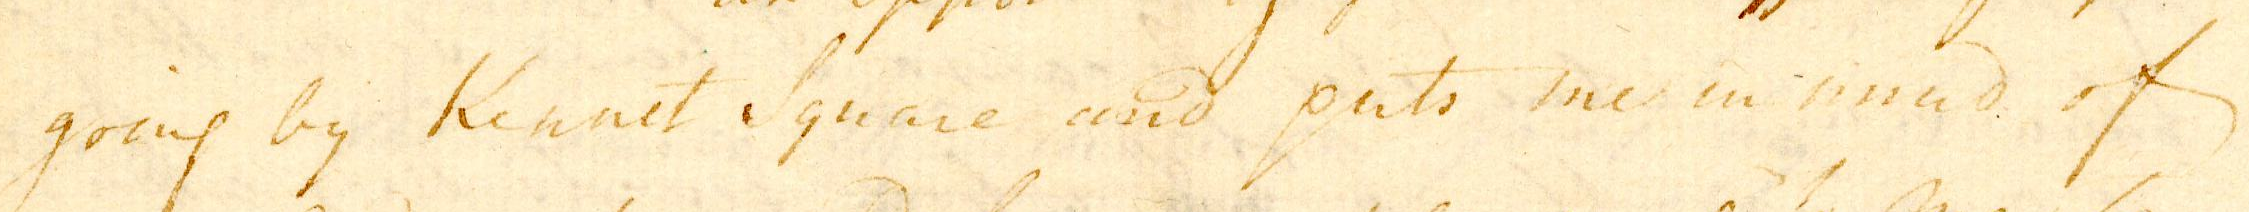going by Kennet Square and puts me in mind of
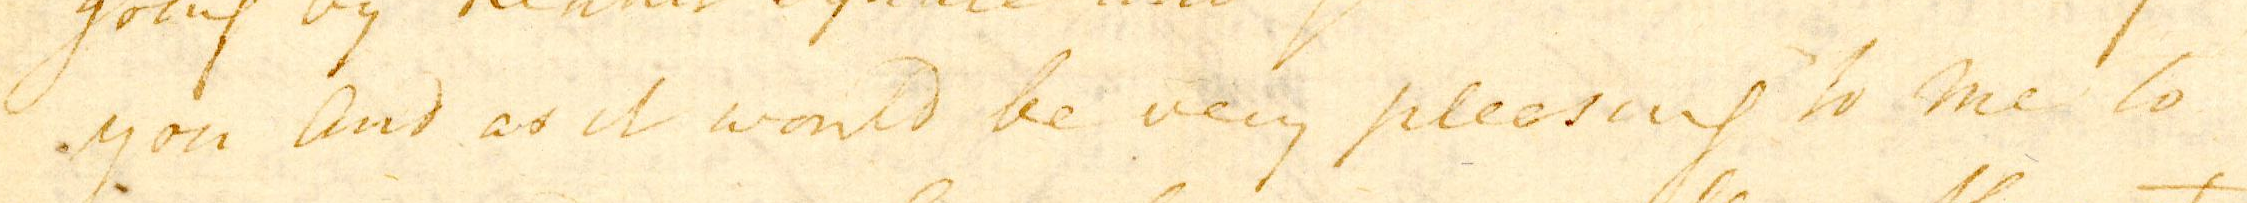you And as it would be very pleasing to me to
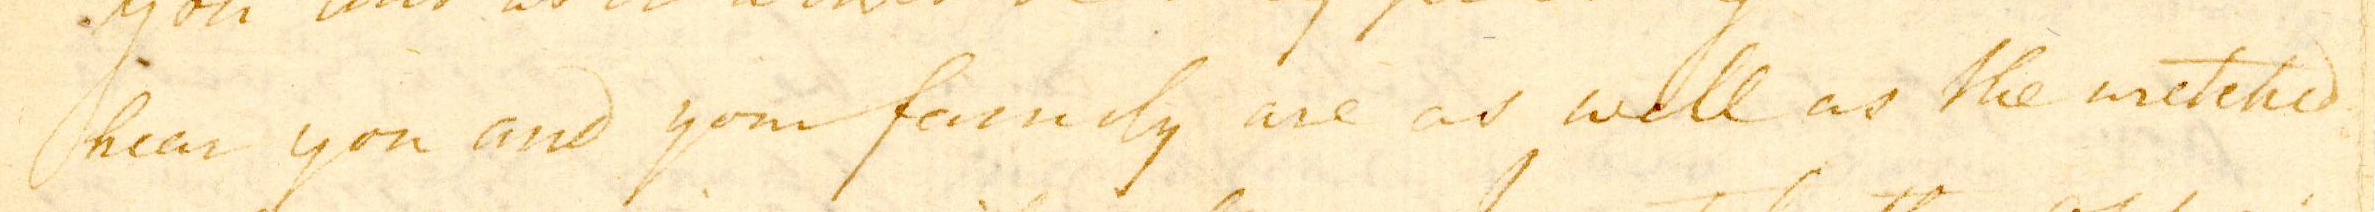hear you and your family are as well as the wretched
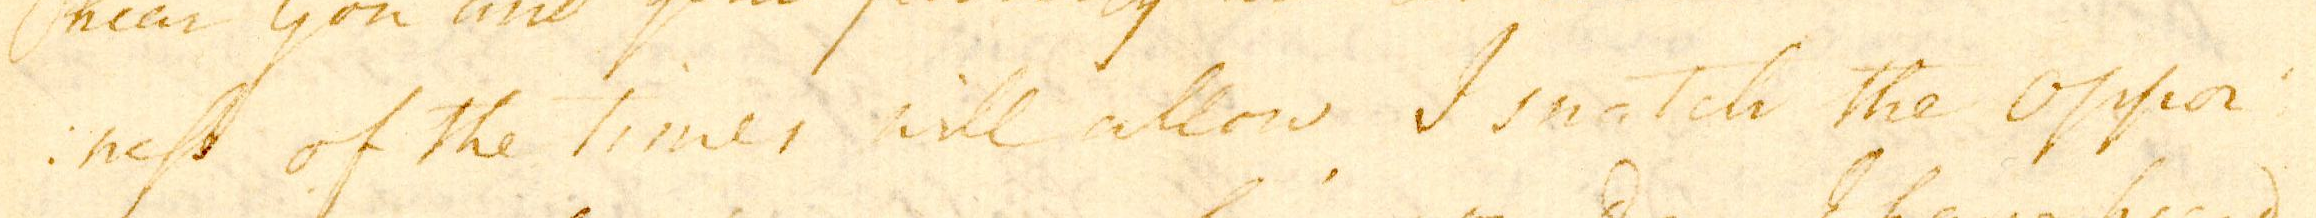:ness of the times will allow, I match the oppor
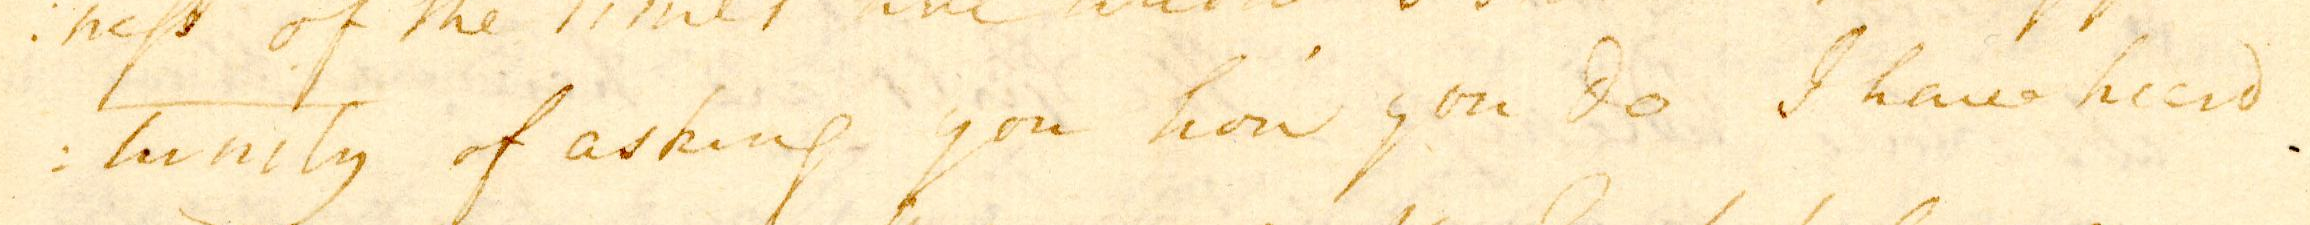:tunity of asking you how you do I have heard
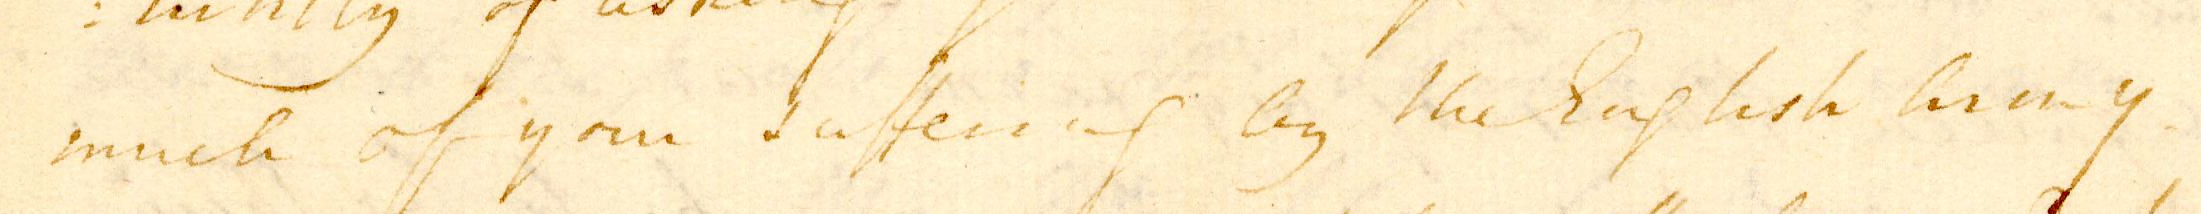much of your suffering by the English Army
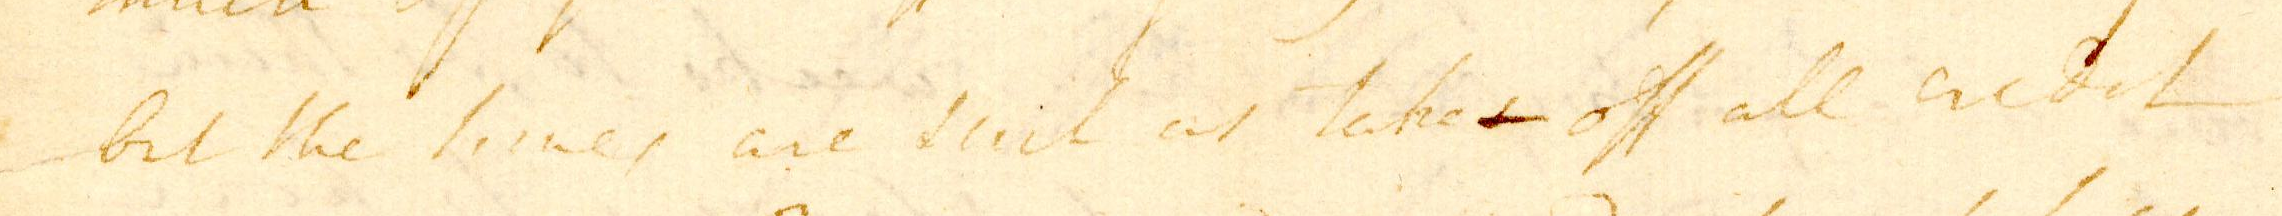but the times are such as take off all credit
